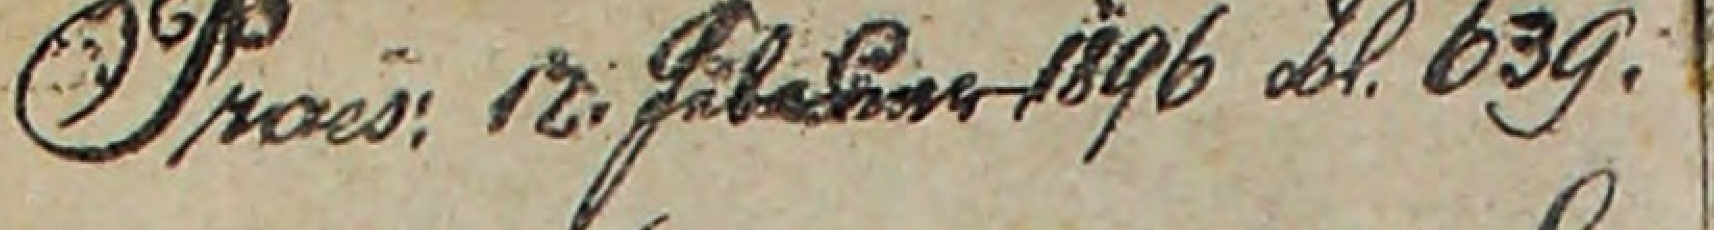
Praes: 12. Februar - 1896 Bl 639.
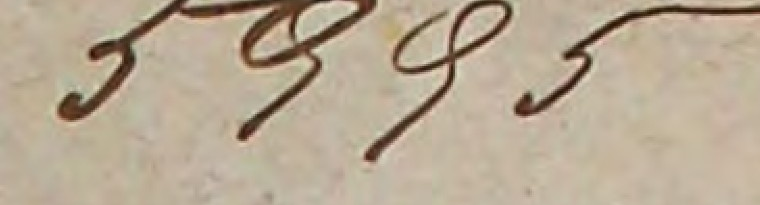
5995
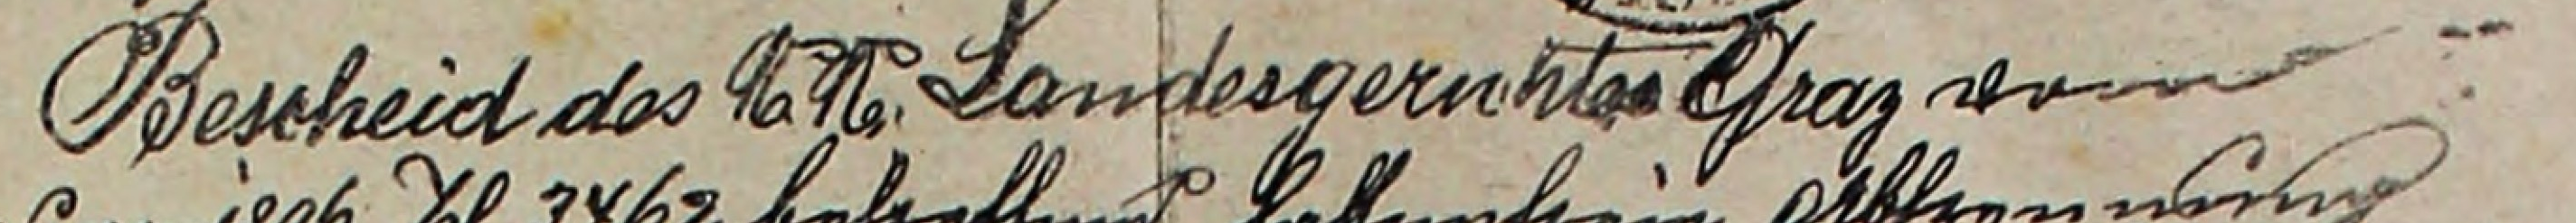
Bescheid des kk. Landesgerechtes Graz vom
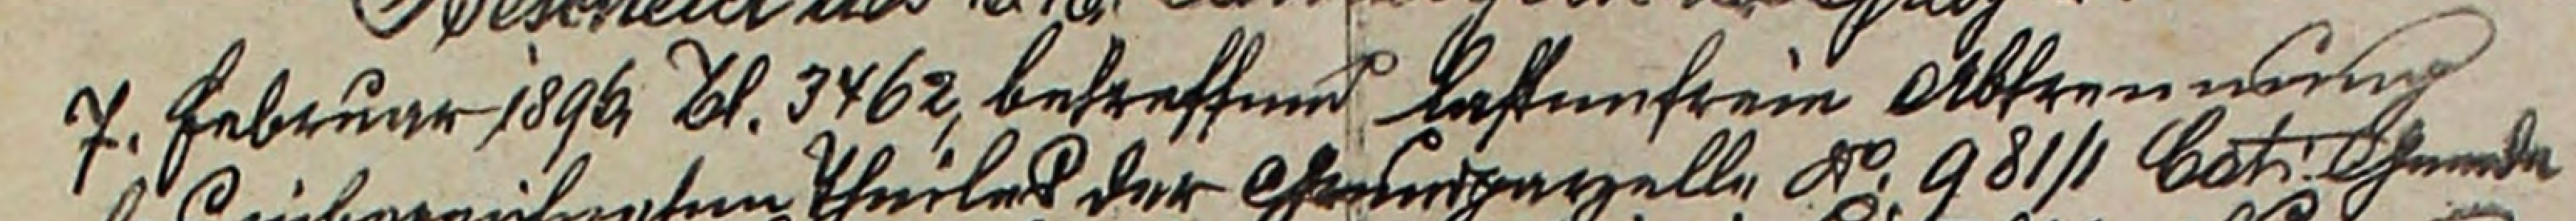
7. Februar 1896 Bl. 3462, betreffend lastenfreie Abtrennung
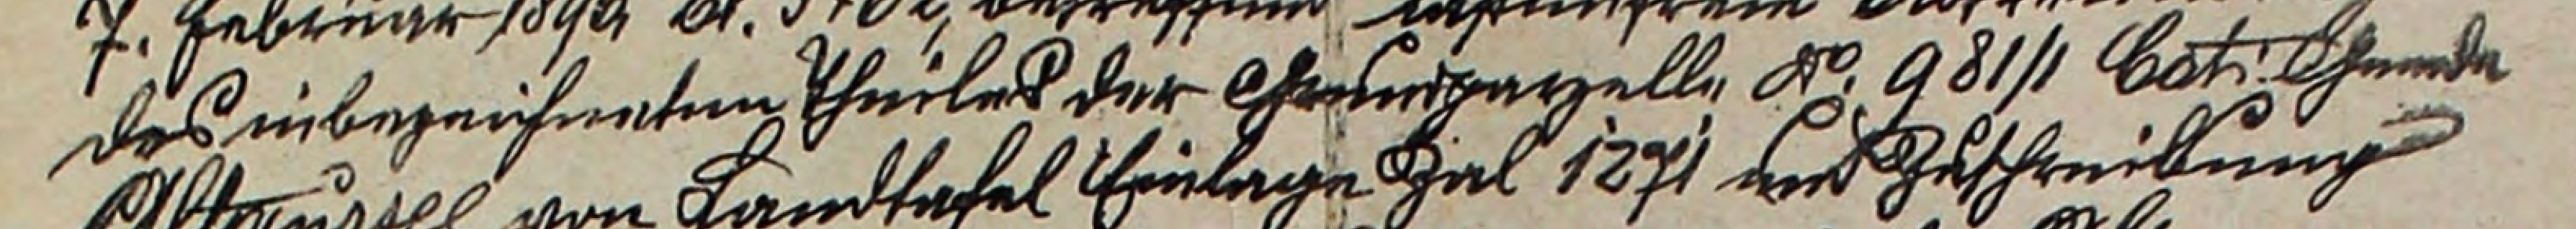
des inbezeichneten Theiles der Grundparzelle No 981/1 Cat. Gende
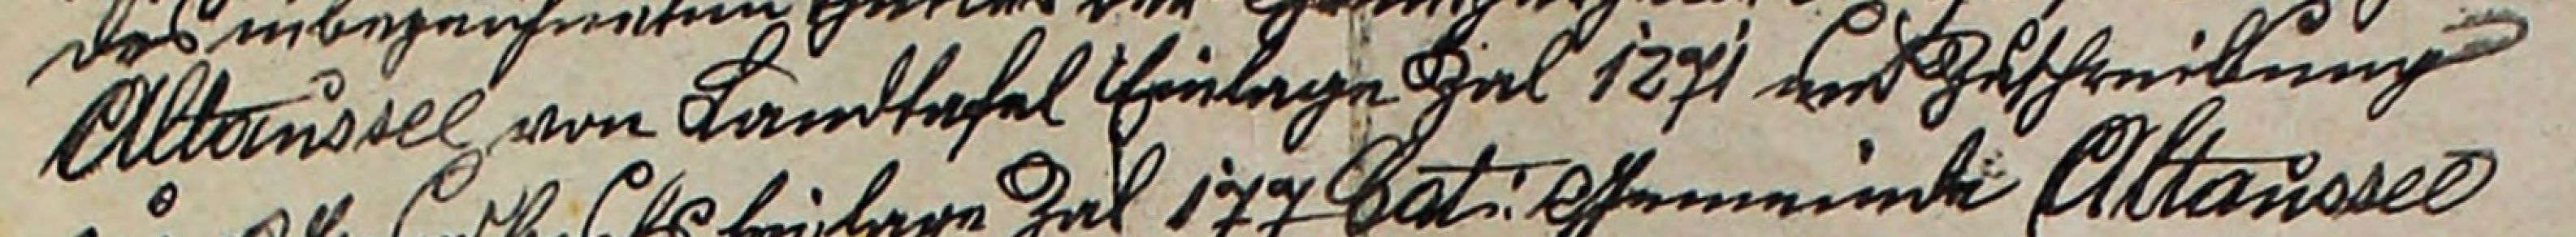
Altaussee von Landtafel Einlage Zal 1271 und Zuschreibung
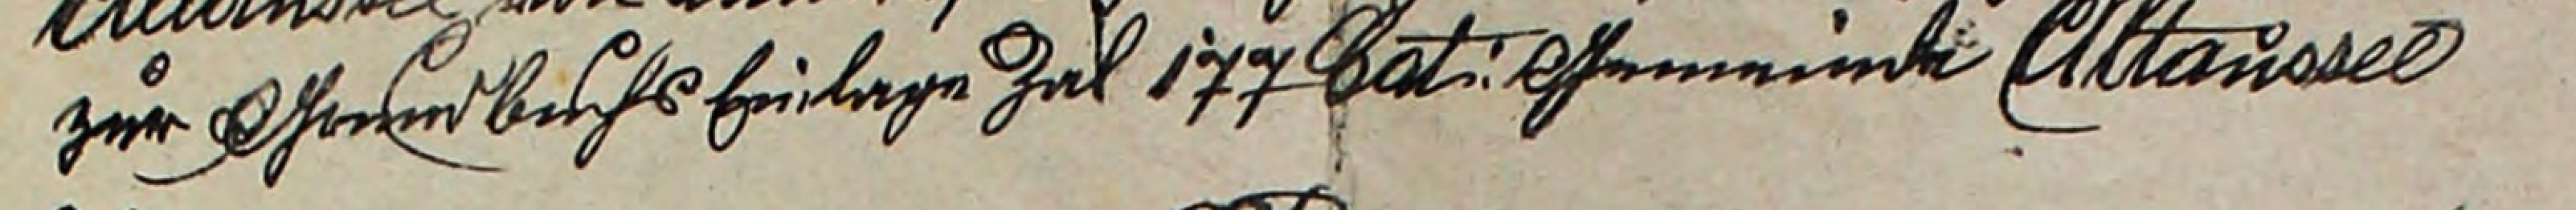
zur Grundbuchs Einlage Zal 177 Cat: Gemeinde Altaussee
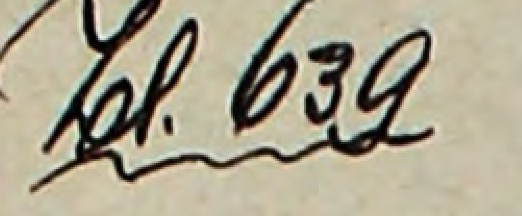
Bl. 639
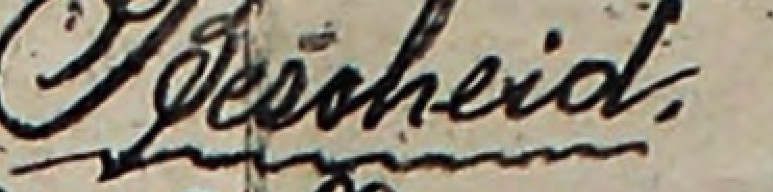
Bescheid.
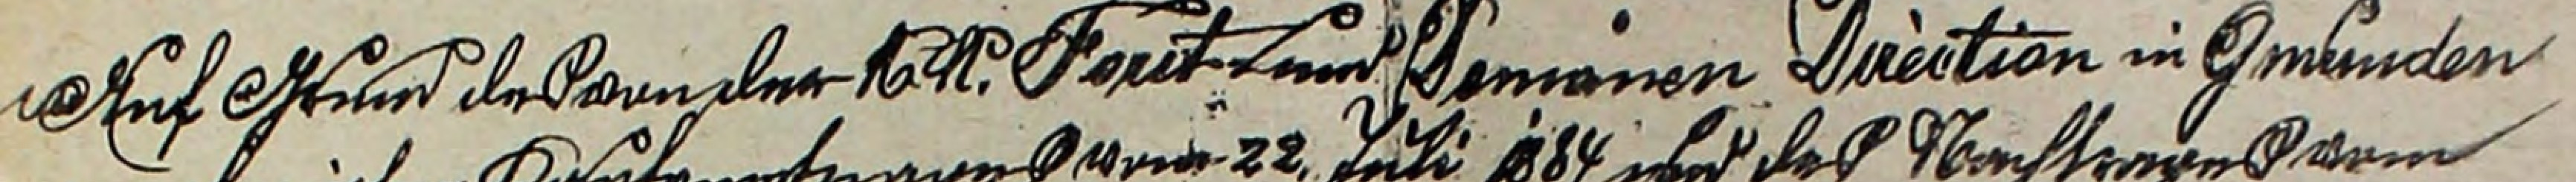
Auf Grund des von der kk. Forst und Domänen Direction in Gmunden
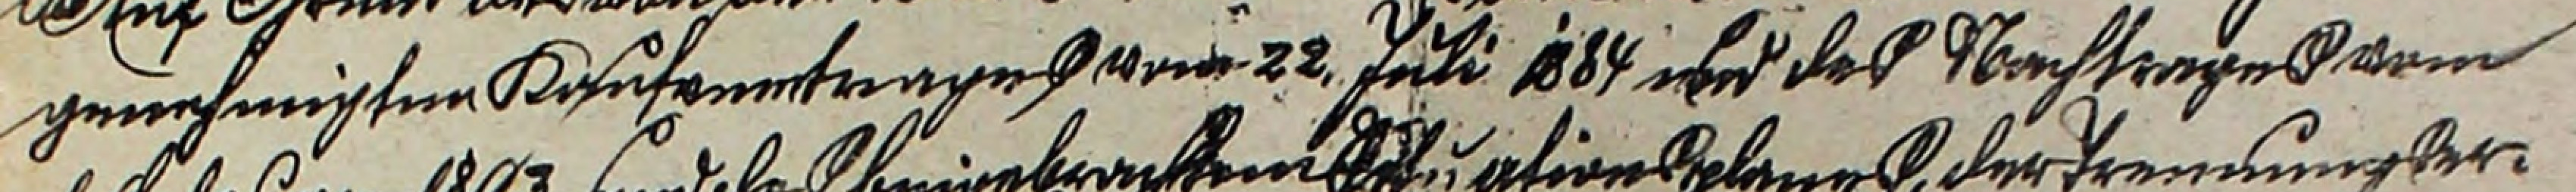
genehmigten Kaufvertrages vom 22. Juli 1884 und des Nachtrages vom
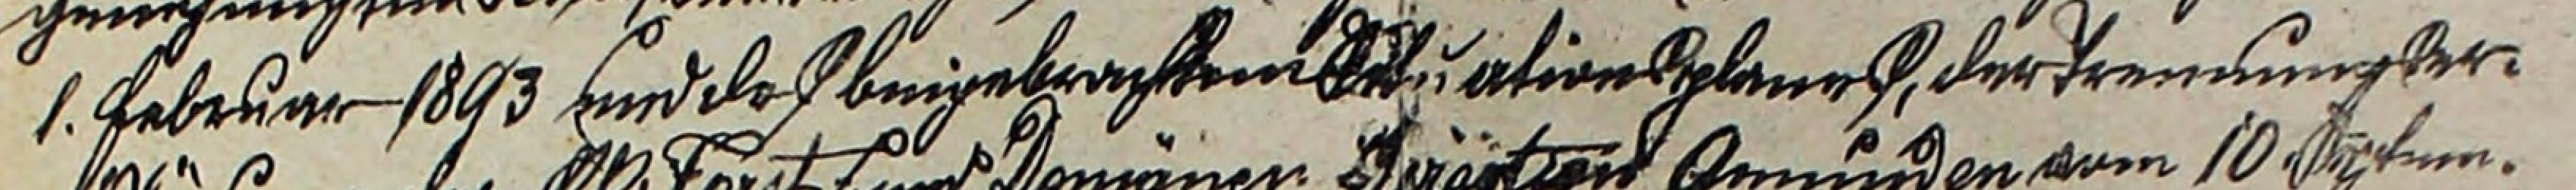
1. Februar 1893 und des beigebrachten Situationsplanes, der Trennungser„
